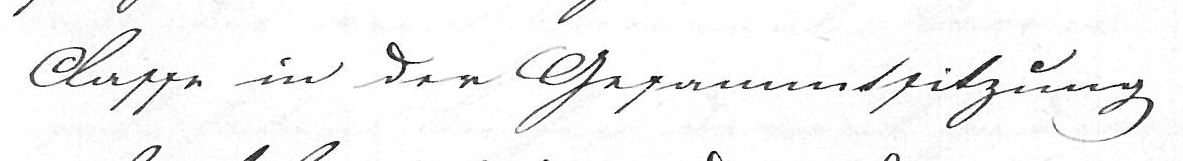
Classe in der Gesammtsitzung
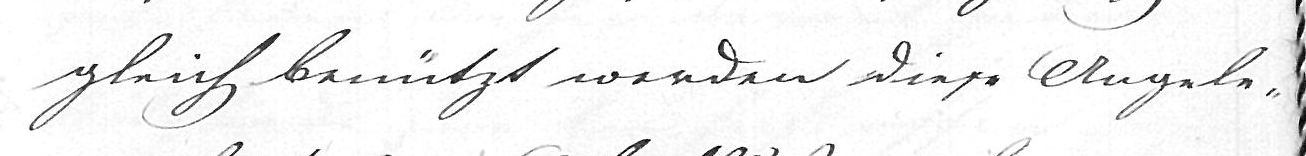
gleich benützt werden diese Angele-
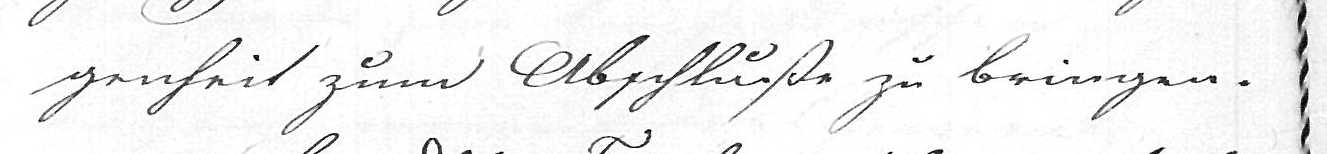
genheit zum Abschluße zu bringen.
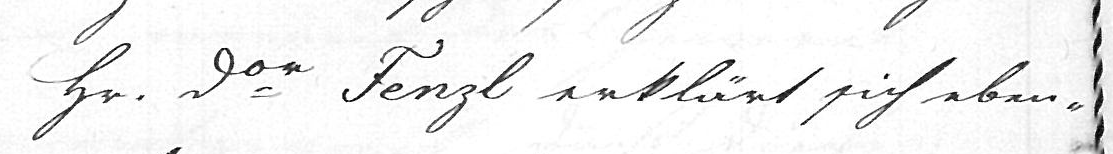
Hr. Dor Fenzl erklärt sich eben-
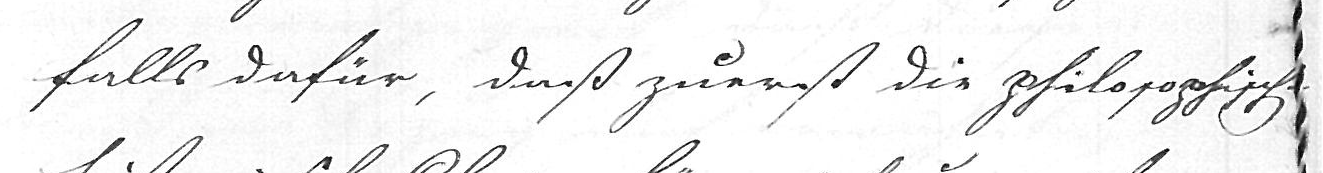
falls dafür, daß zuerst die philosophisch-
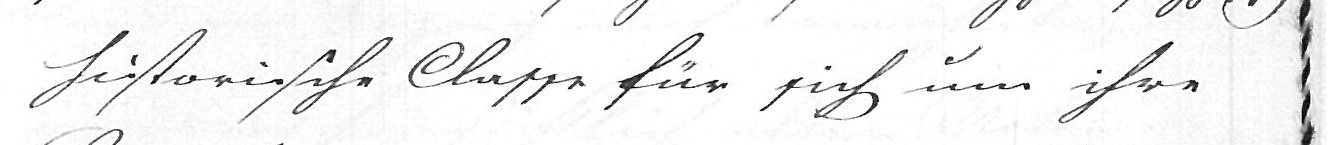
historische Classe für sich um ihre
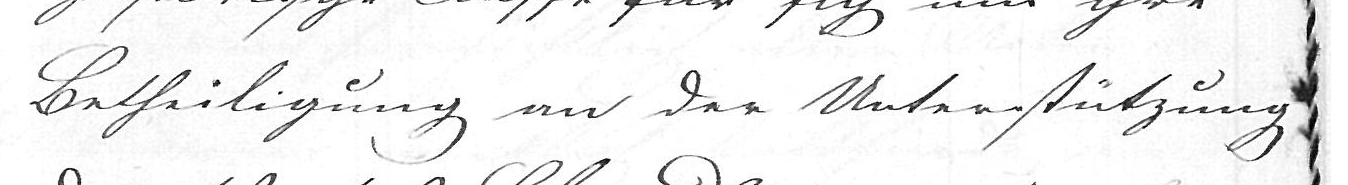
Betheiligung an der Unterstützung
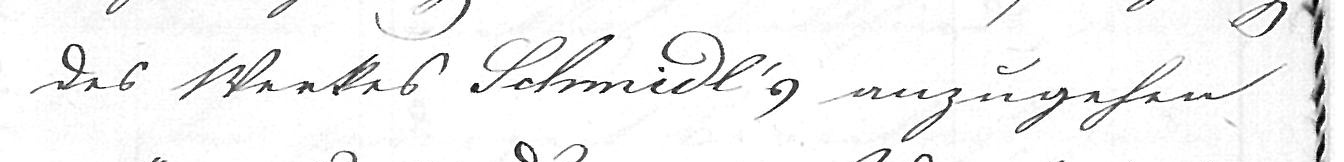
des Werkes Schmidl's anzugehen
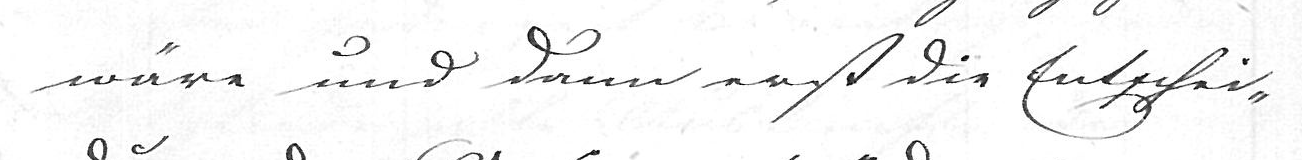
wäre und denn erst die Entschei-
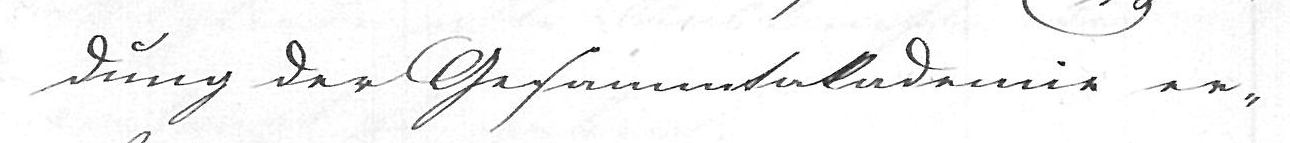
dung der Gesammtakademie er-
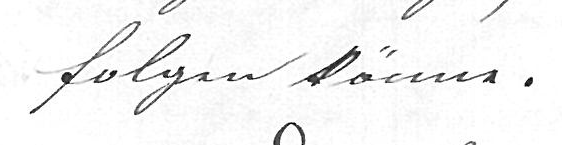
folgen könne.
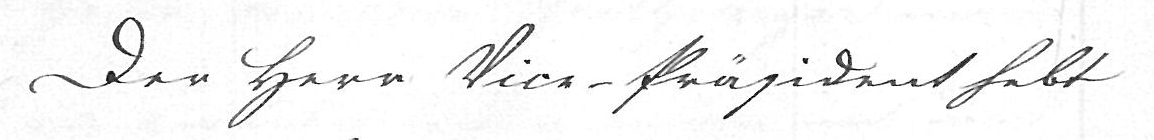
Der Herr Vice-Präsident hebt
